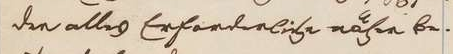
den alles Erforderliche näher be-
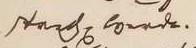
sprechen werde.
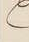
den
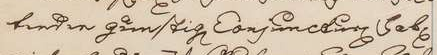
tenden günstigen Conjuncturen haben
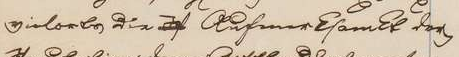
vielorts die Sp Aufmerksamkt der
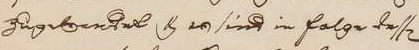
zugewendet & es sind in Folge dessen
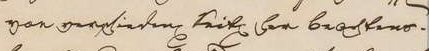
von verschiedenen Seiten her beachtens-
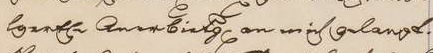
werthe Anerbietungen an mich gelangt.
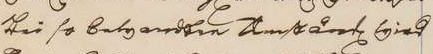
Bei so bewandten Umständen wird
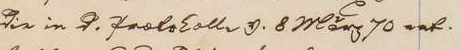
die in d. Protokolle v. 8 März 70 ent-
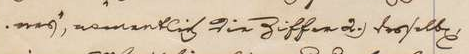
nes», namentlich die Ziffer 2.) desselben,
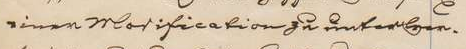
einer Modification zu unterwer-
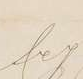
fen
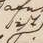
werden
